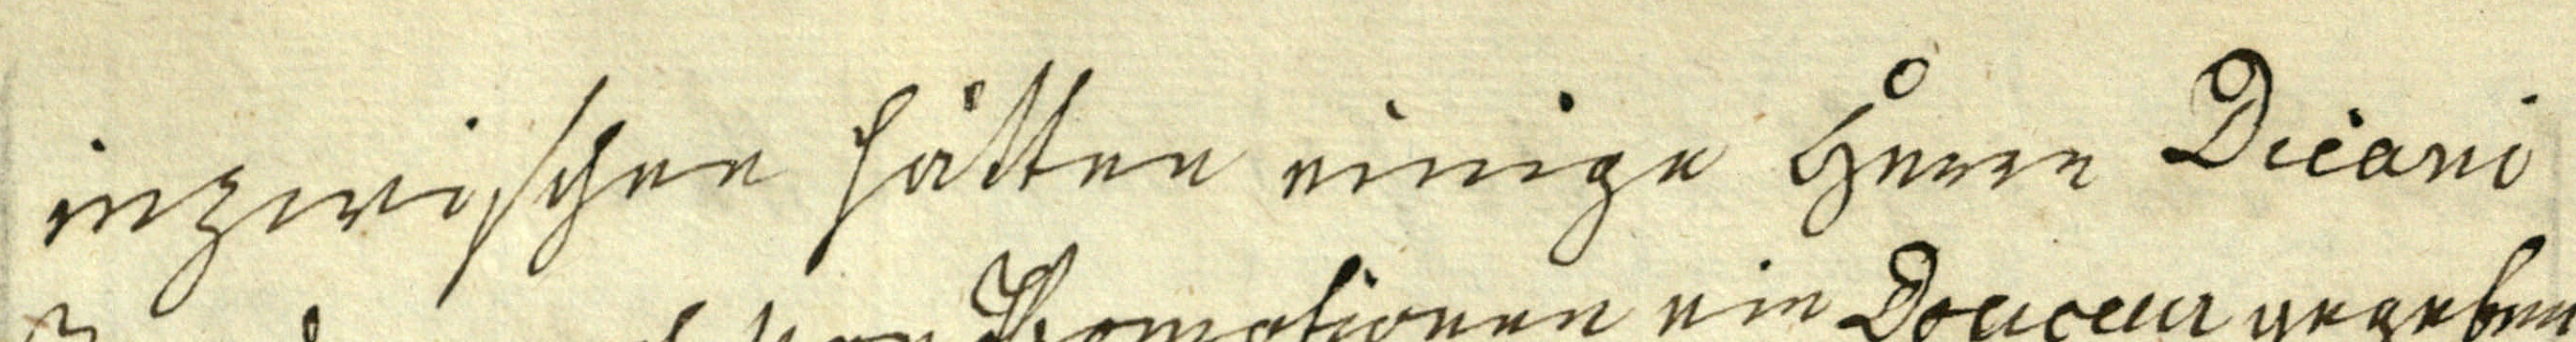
inzwischen hätten einige Herrn Decani
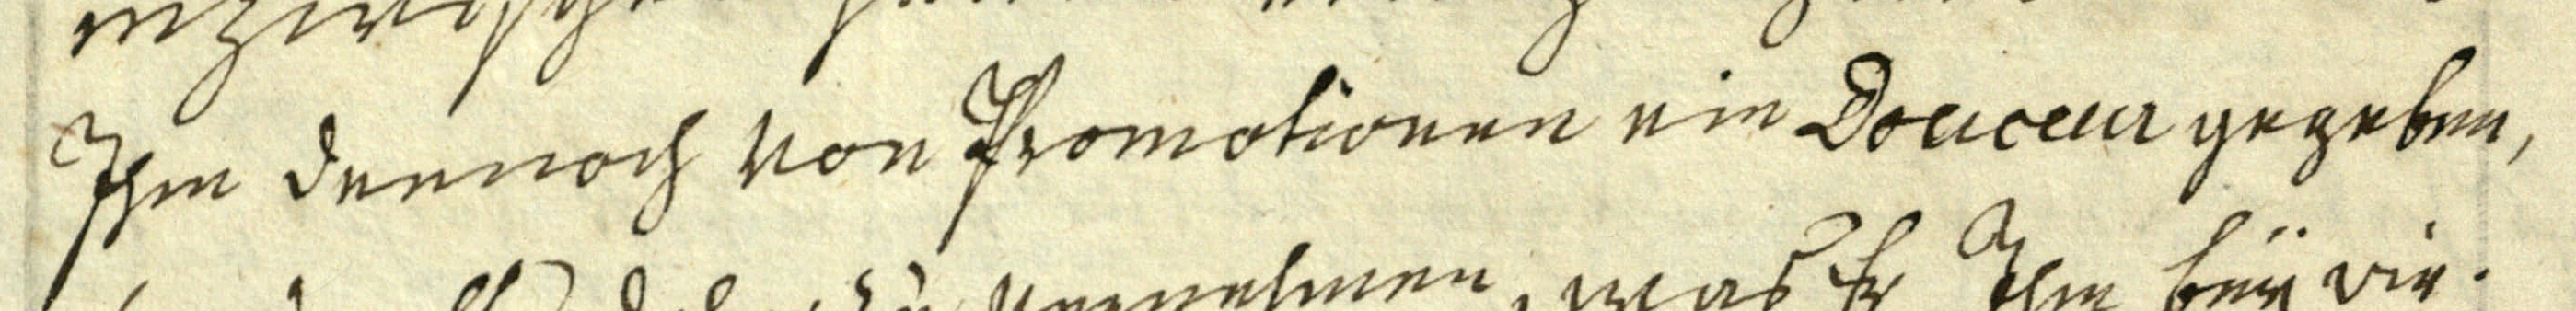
Ihm dennoch von Promotionen ein Douceur gegeben,
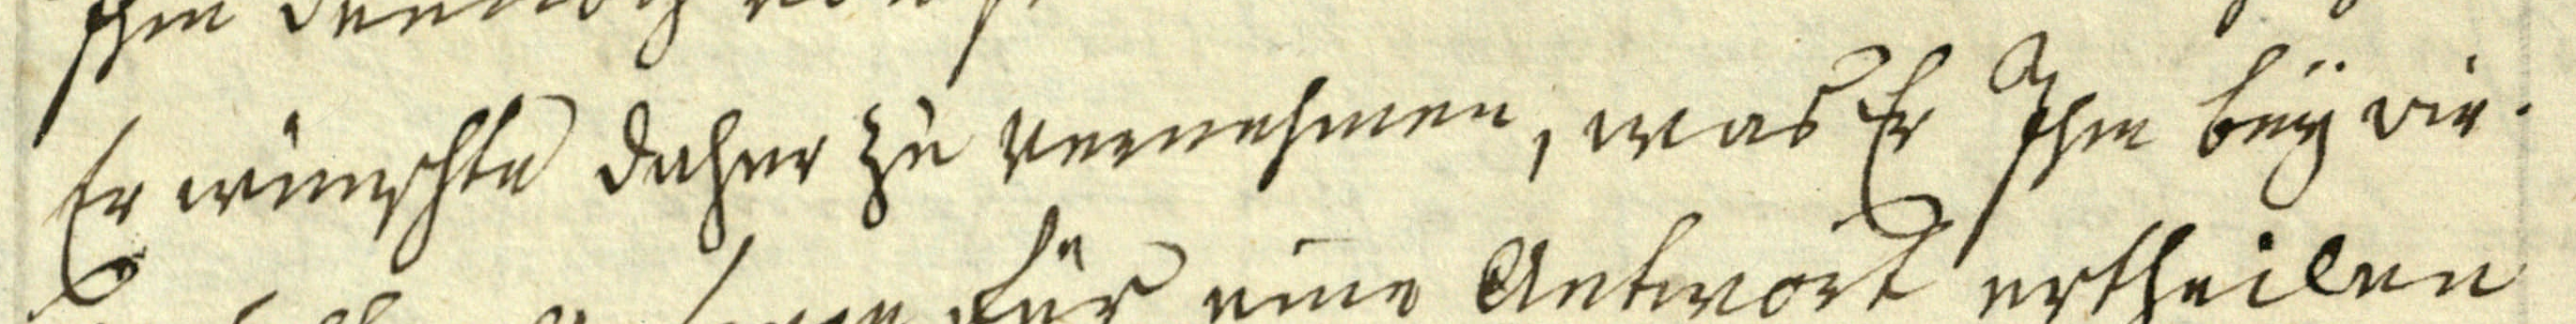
Er wünschte daher zu vernehmen, was Er Ihm beÿ wie¬
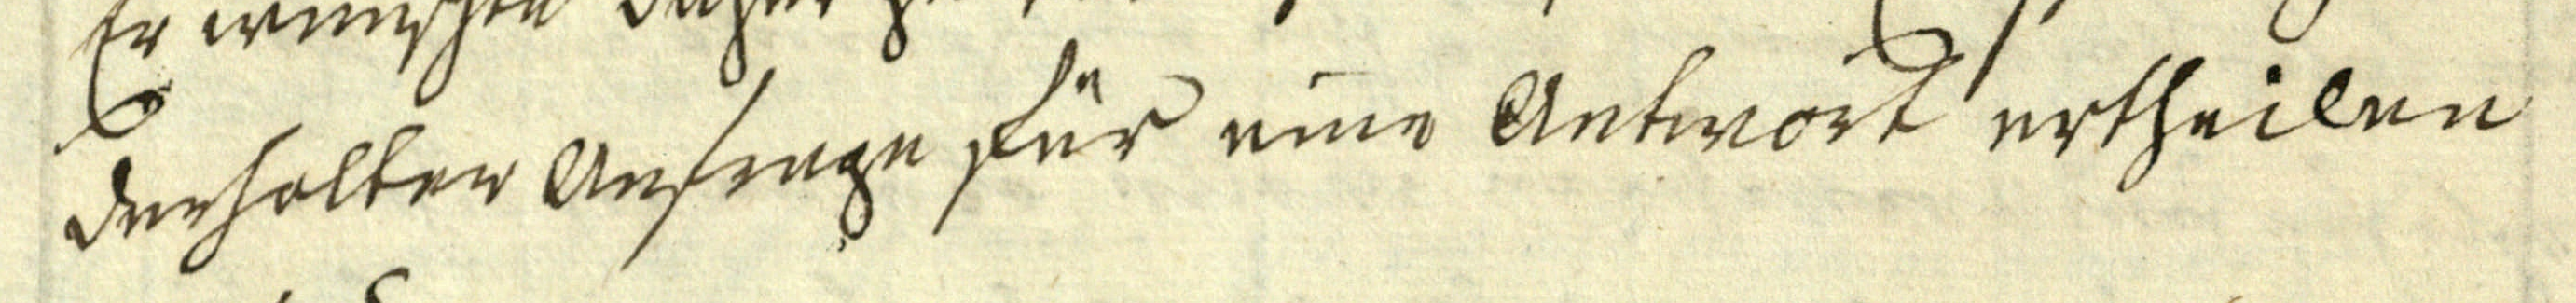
derholter Anfrage für eine Antwort ertheilen
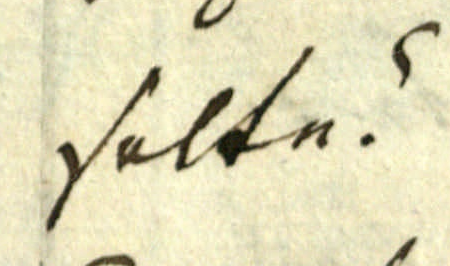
solte?
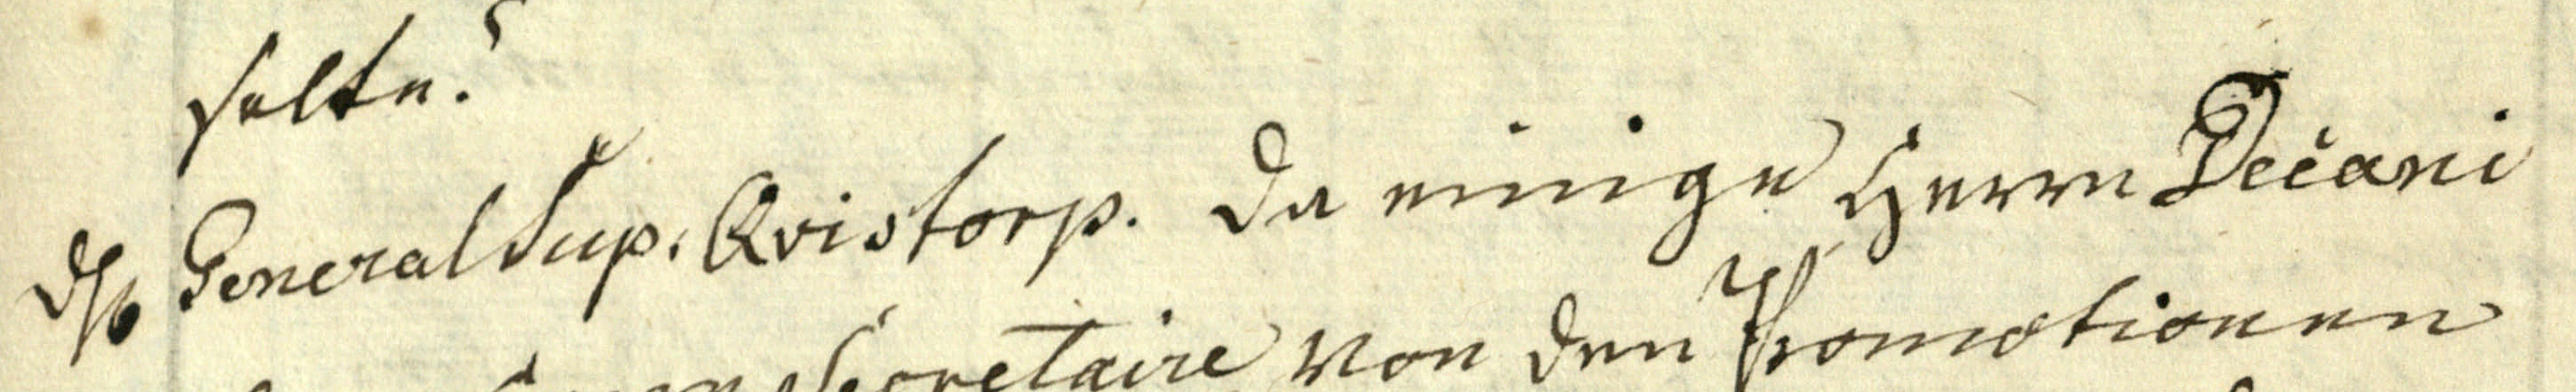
dh. GeneralSup. Quistorp. Da einige Herrn Decanii
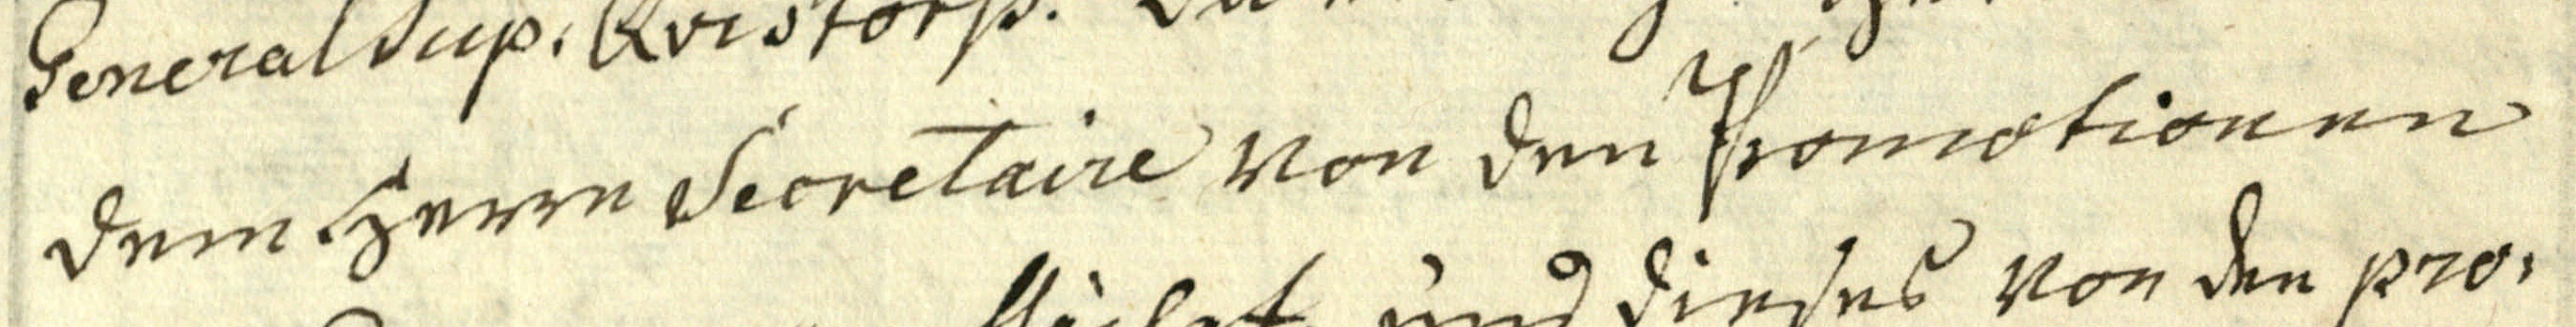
dem Herrn Secretaire von den Promotionen
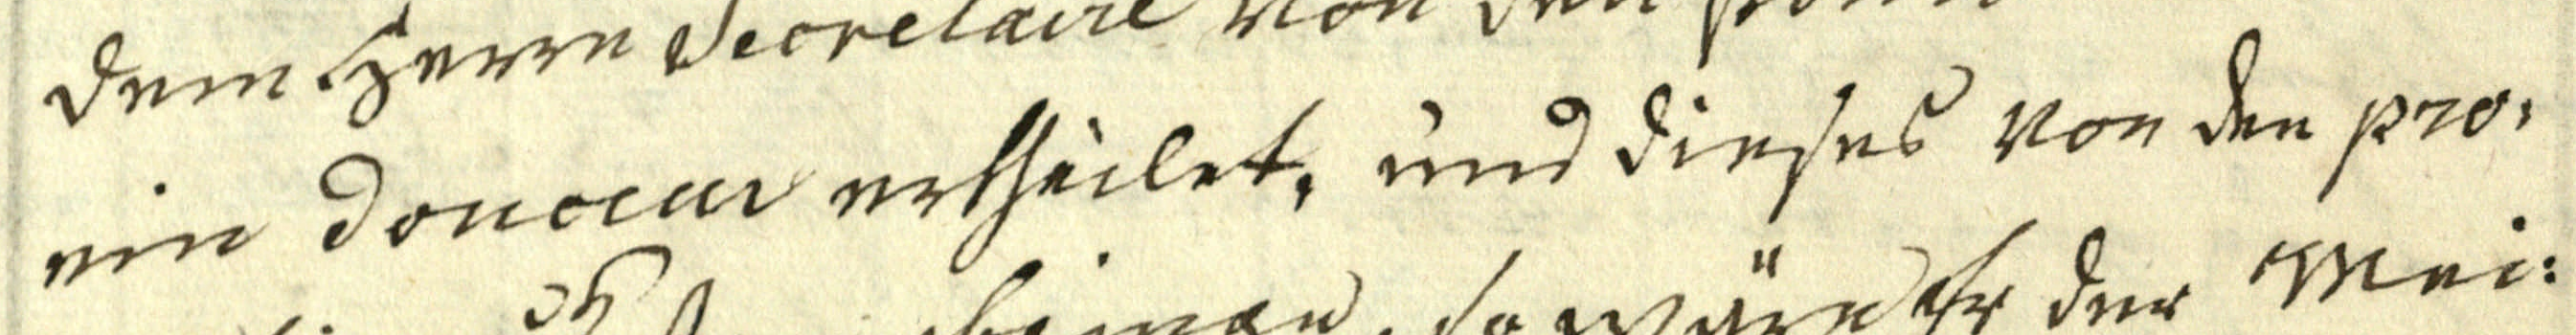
ein douceur ertheilet, und dieses von den pro¬
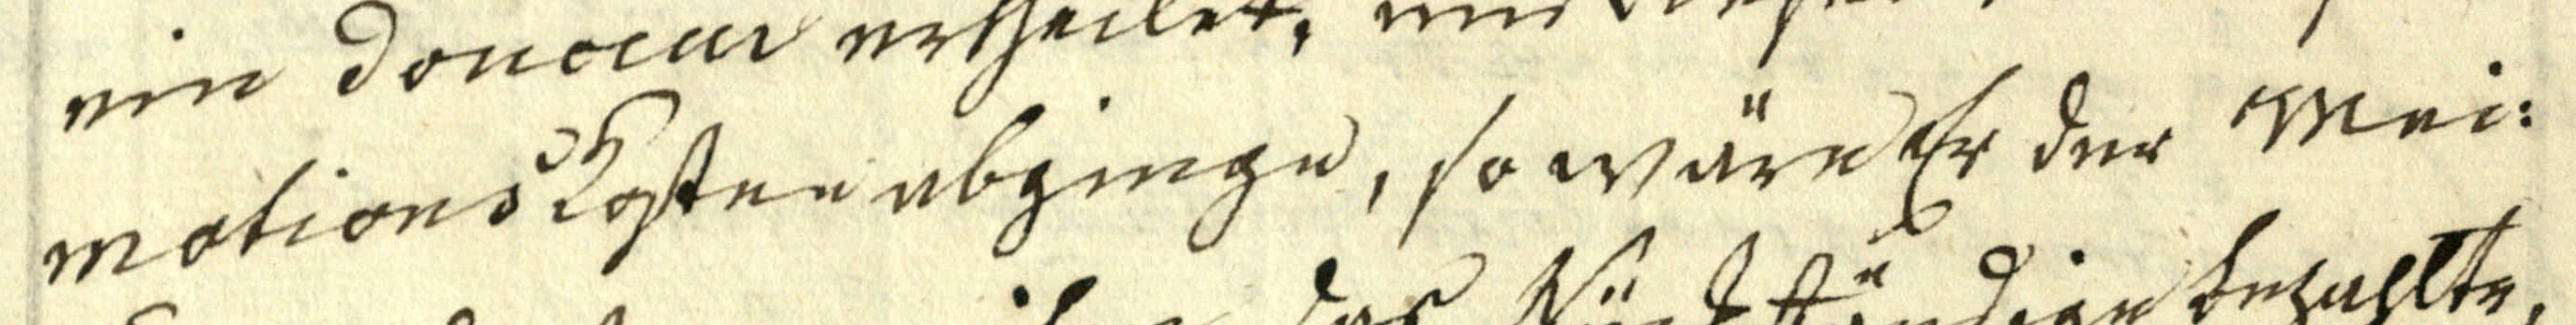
mations Kosten abginge, so wäre Er der Mei¬
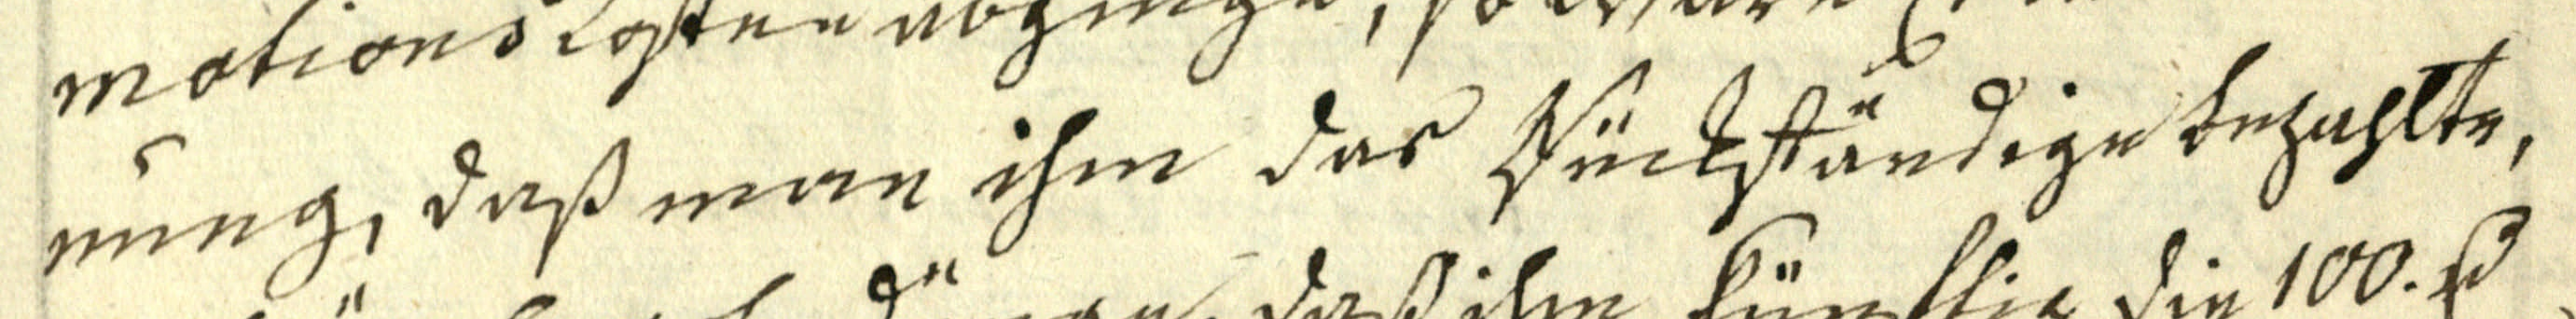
nung, daß man ihm das Rückständige bezahlte,
